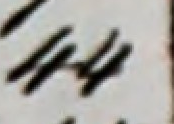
44
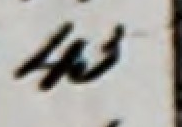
43
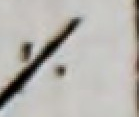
./.
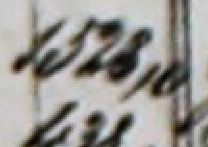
1528/?
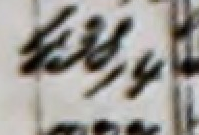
438/4
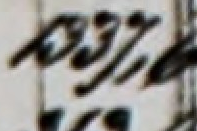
1337/6
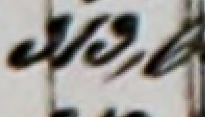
313,6
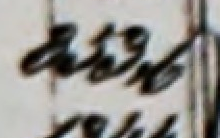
853,6
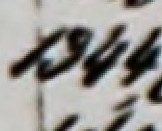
1344
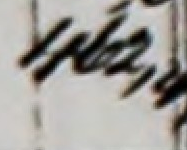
1162,4
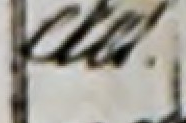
Alt.
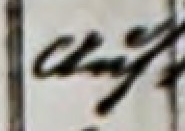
Aus
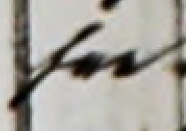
see
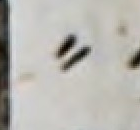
„
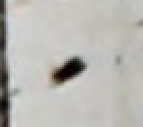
„
